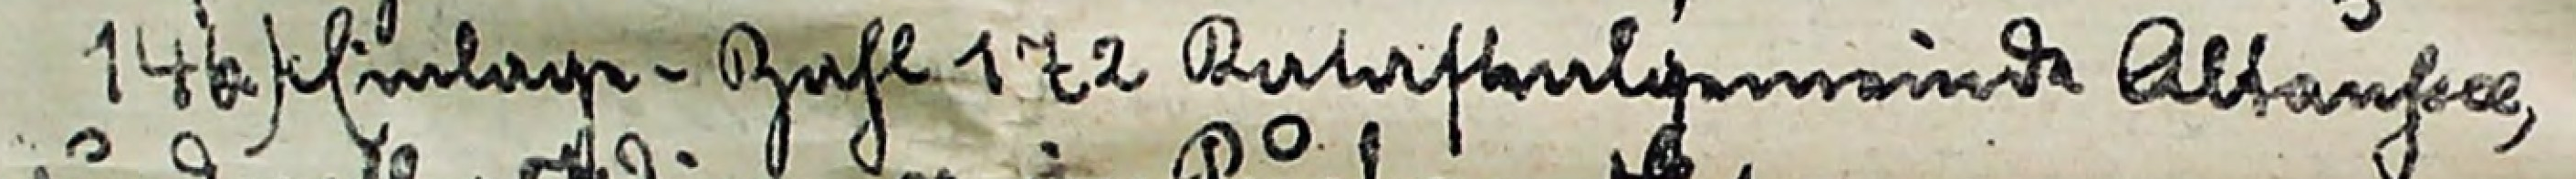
146.) Einlage - Zahl 172 Katastralgemeinde Altaussee,
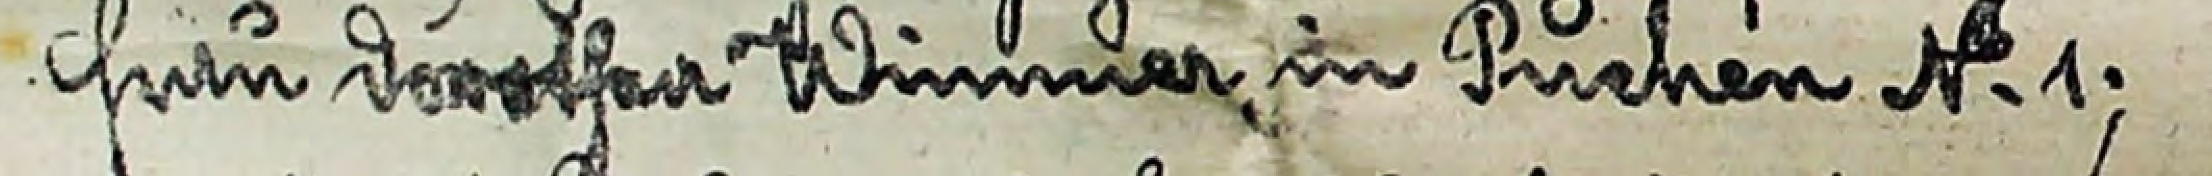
Frau Dorothea Wimmer, in Puchen № 1;
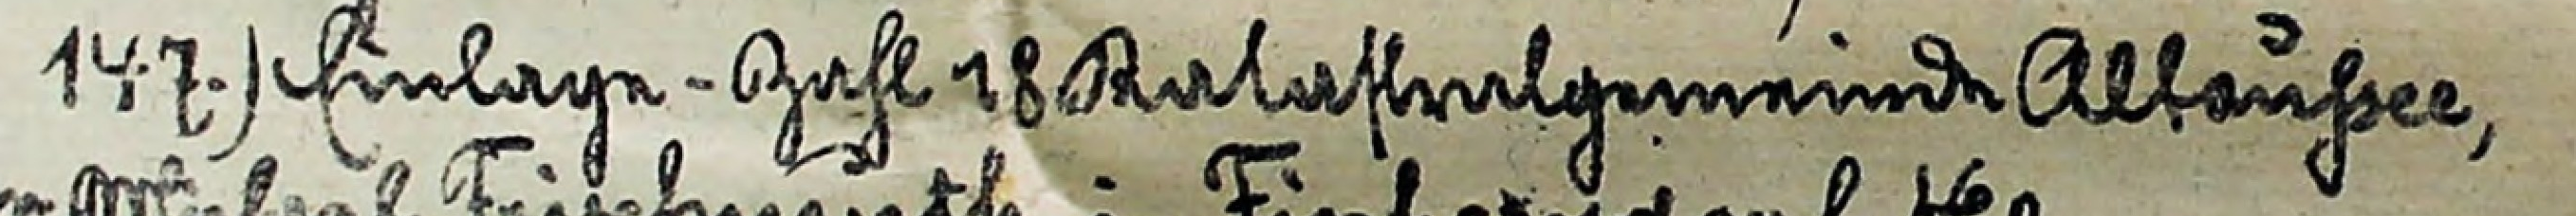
147.) Einlage - Zahl 18 Katastralgemeinde Altaussee,
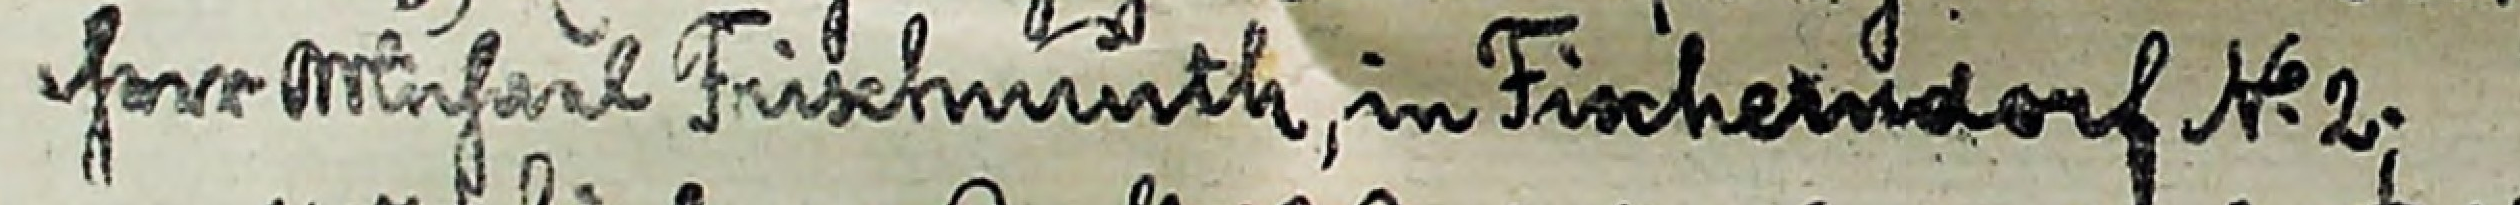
Herr Michael Frischmuth, in Fischerndorf № 2;
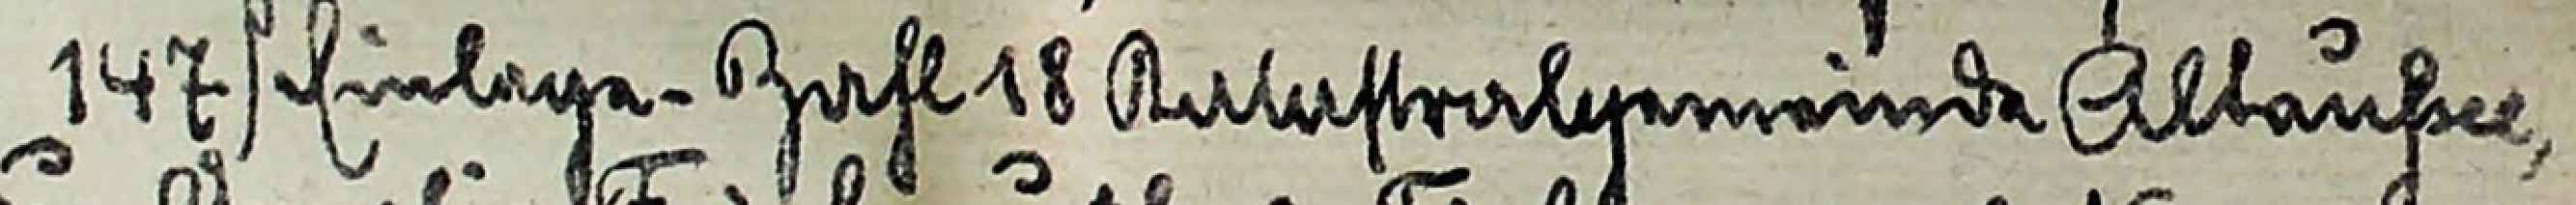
147.) Einlage - Zahl 18 Katastralgemeinde Altaussee,
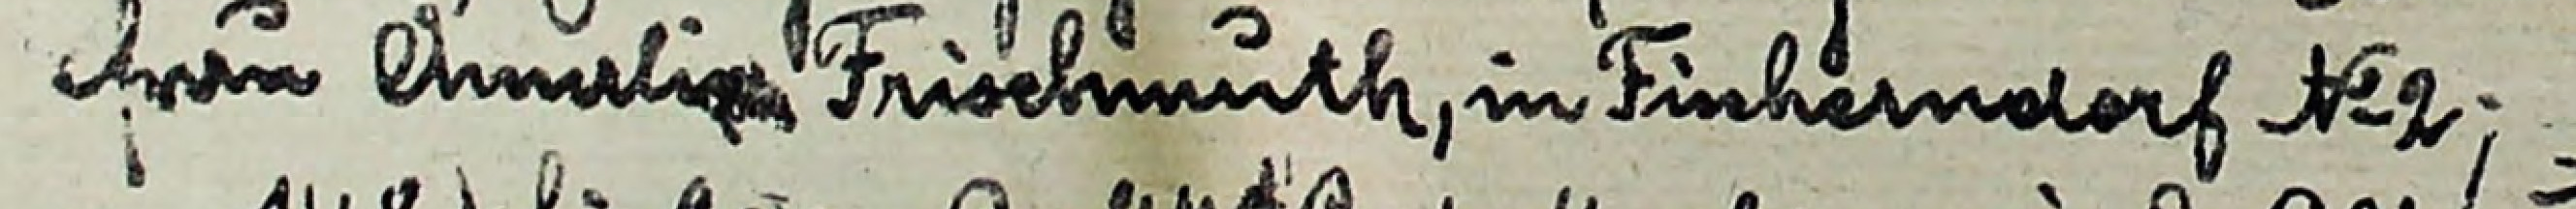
Frau Amalie Frischmuth, in Fischerndorf № 2;
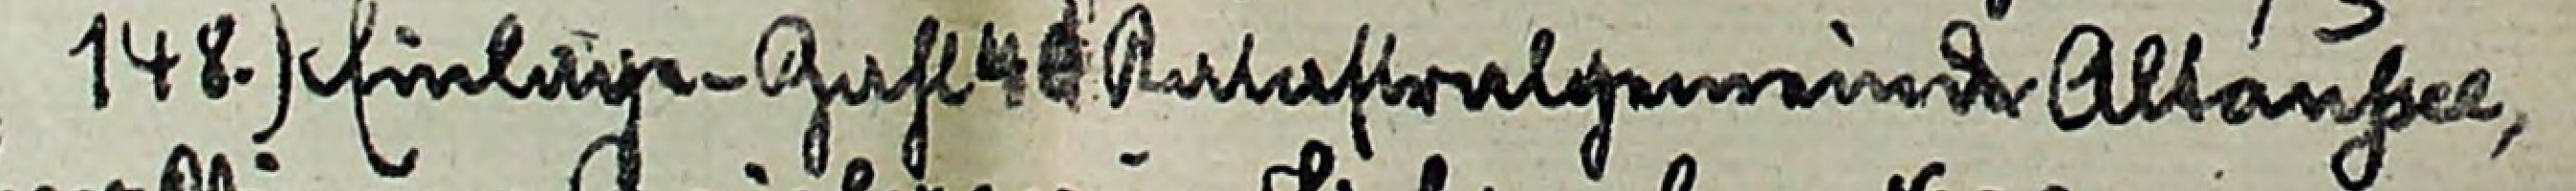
148.) Einlage - Zahl 40 Katastralgemeinde Altaussee,
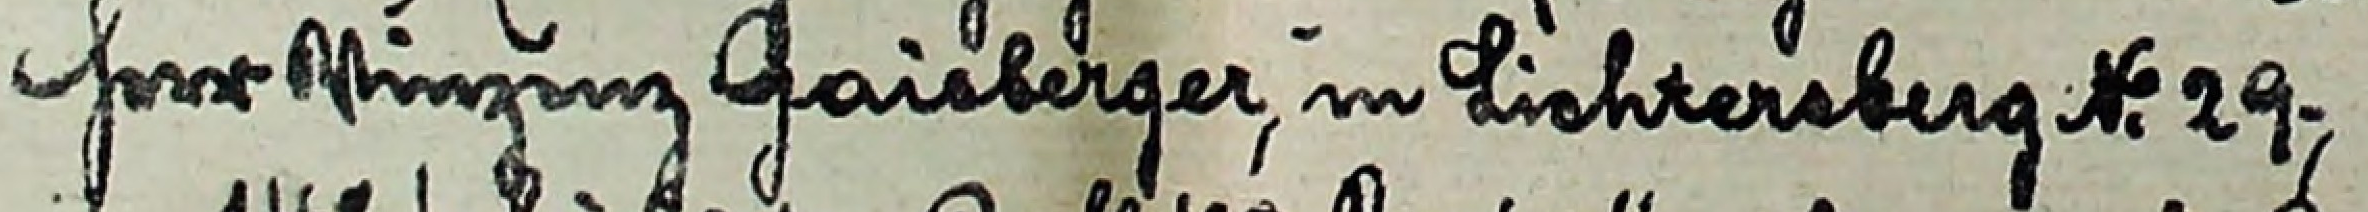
Herr Vinzenz Gaisberger, in Lichtersberg № 29;
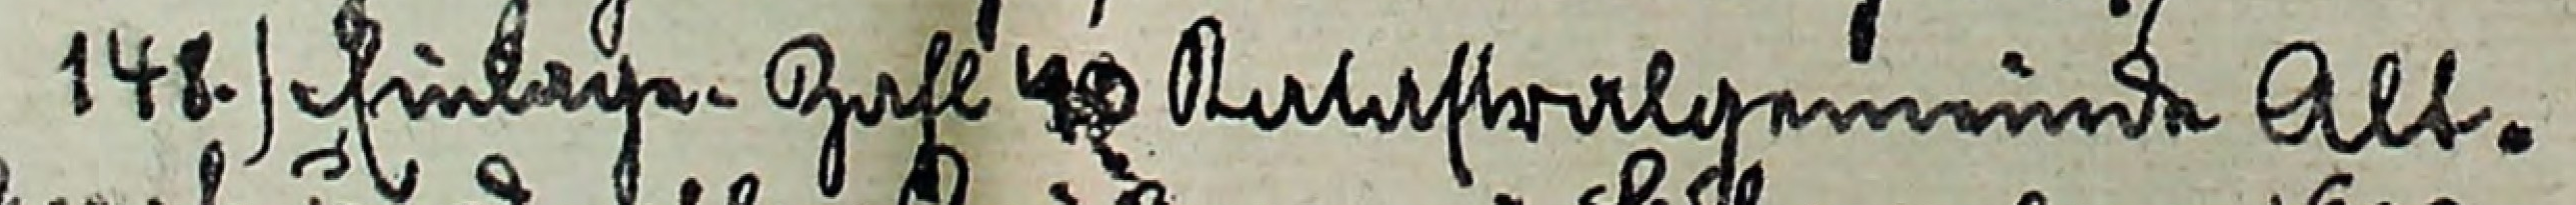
148.) Einlage - Zahl 40 Katastralgemeinde Alt=
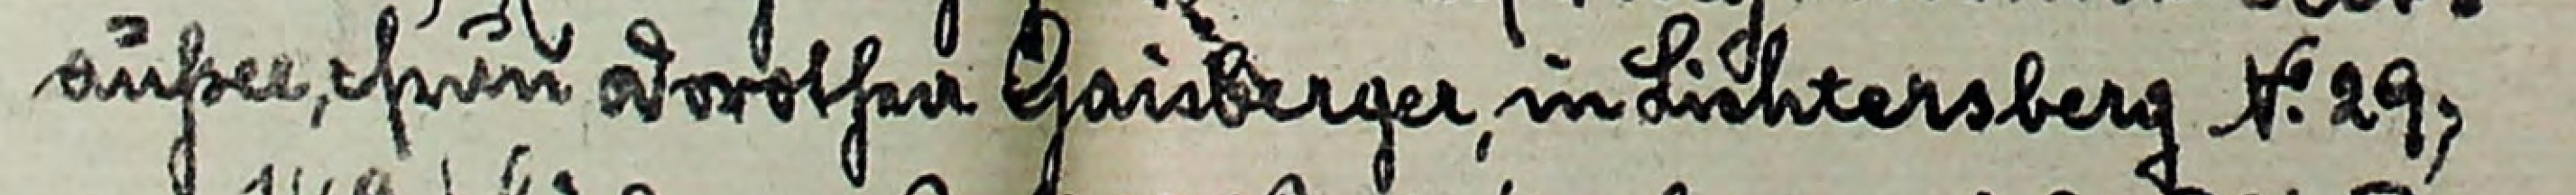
aussee, Frau Dorothea Gaisberger, in Lichtersberg № 29;
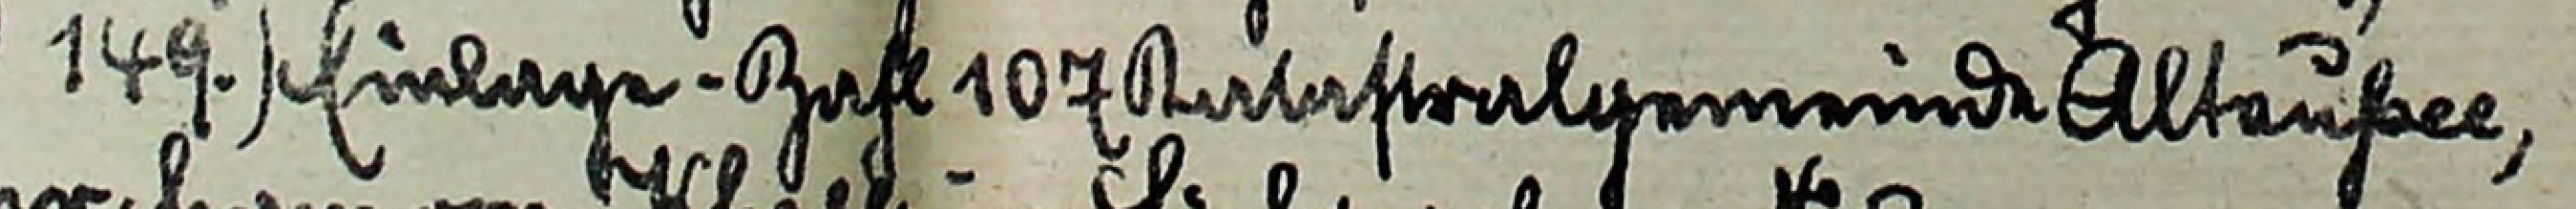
149.) Einlage - Zahl 107 Katastralgemeinde Altaussee,
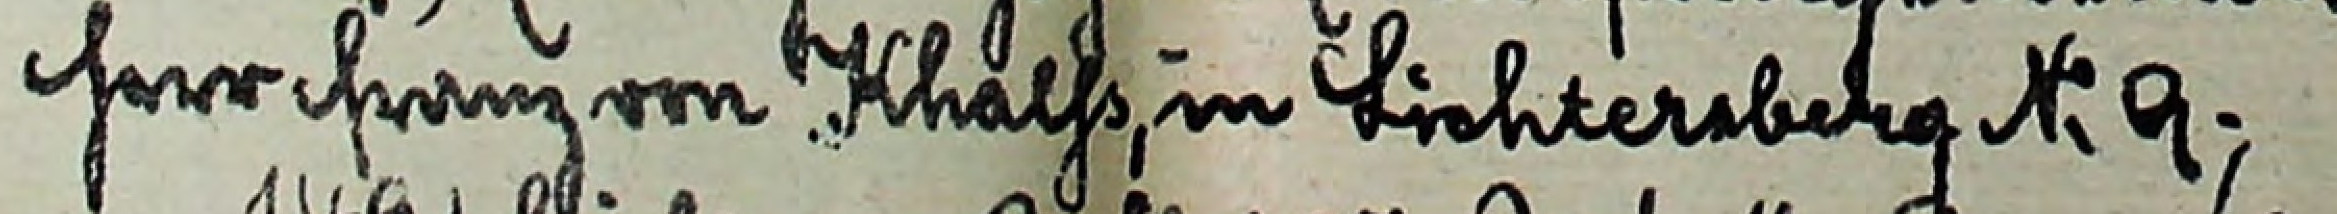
Herr Franz von Khalhs, in Lichtersberg № 9;
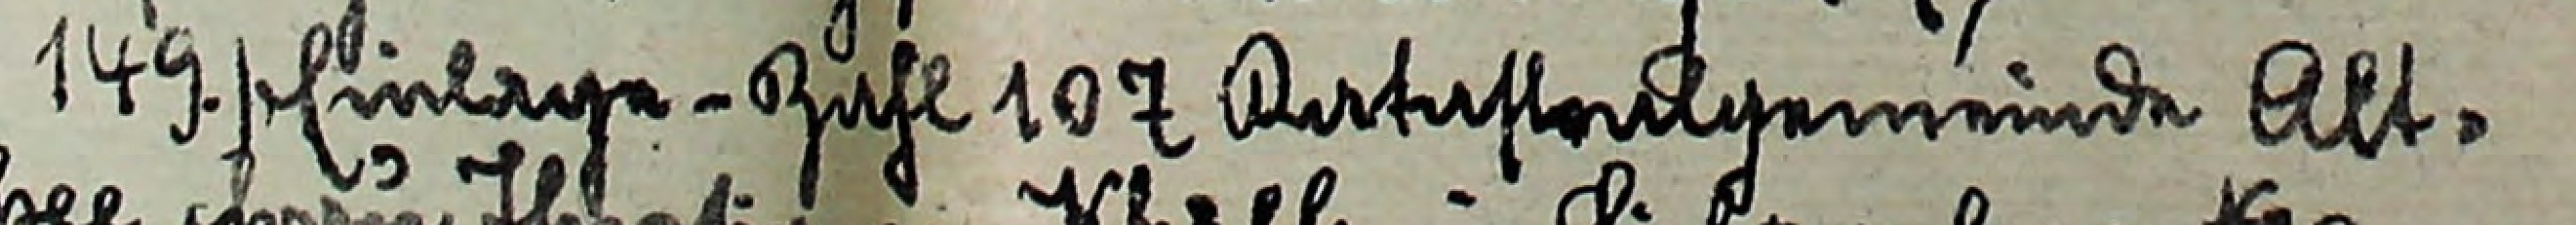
149.) Einlage - Zahl 107 Katastralgemeinde Alt=
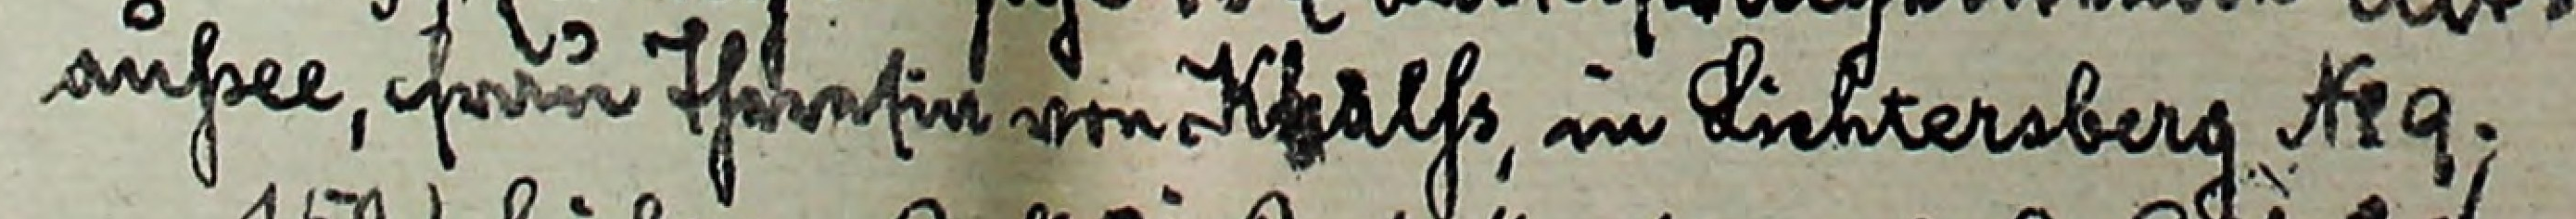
aussee, Frau Theresia von Khalhs, in Lichtersberg № 9;
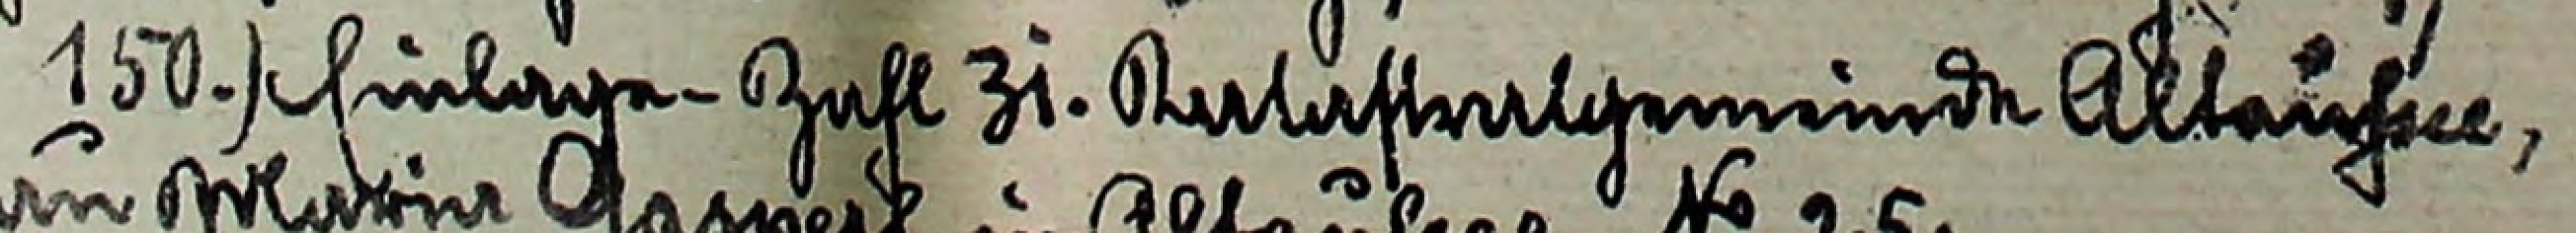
150.) Einlage - Zahl 31. Katastralgemeinde Altaussee,
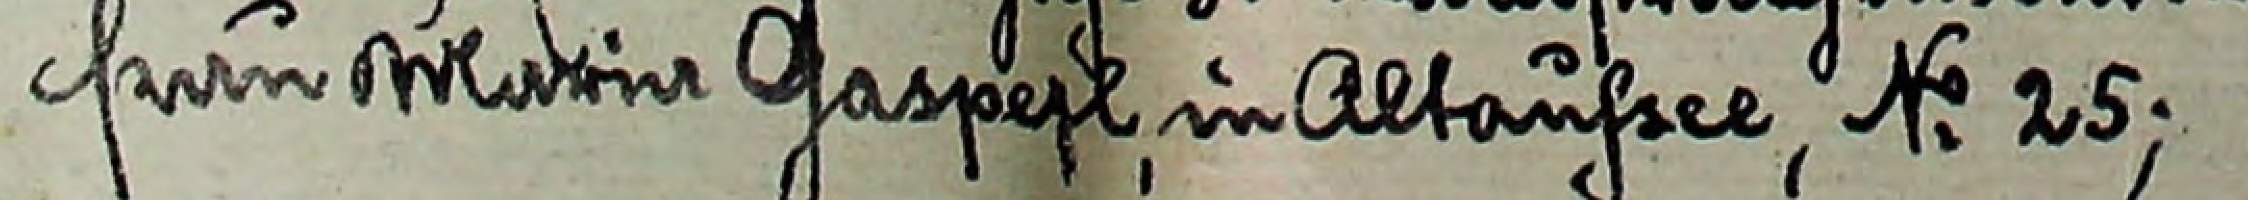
Frau Maria Gasperl, in Altaussee, № 25;
